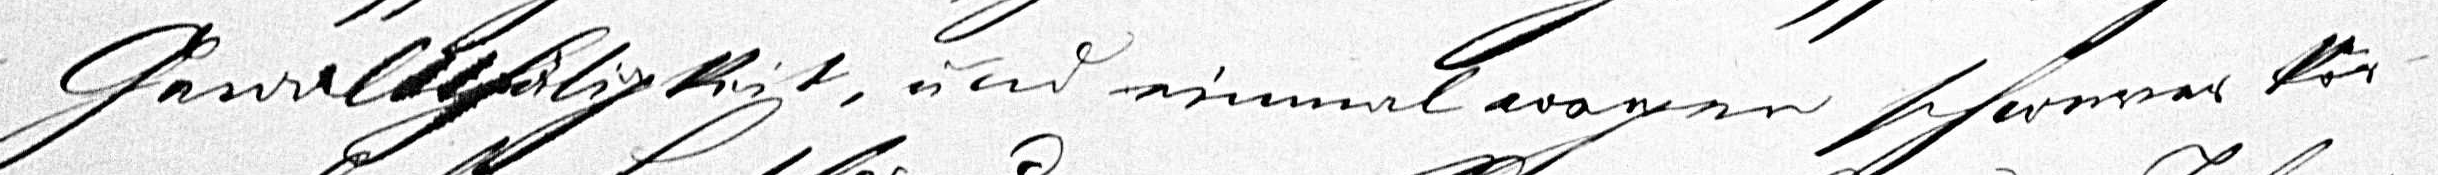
Gewaltthätigkeit, und einmal wegen schwerer kör¬
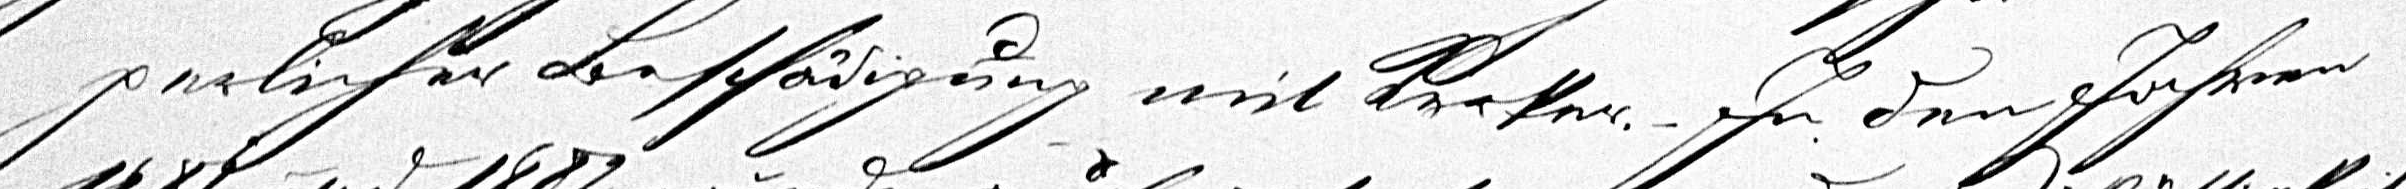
perlicher Beschädigung mit Kerker. In den Jahren
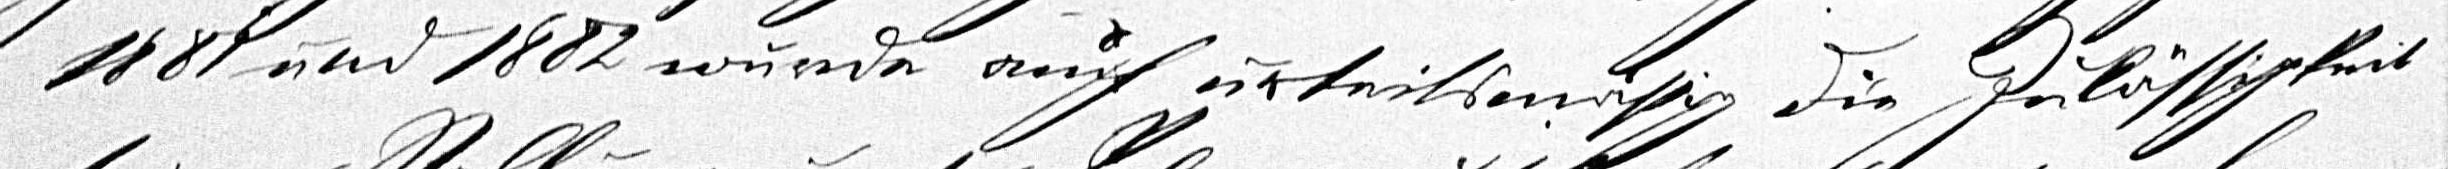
1881 und 1882 wurde auch urteilsmässig die Zulässigkeit
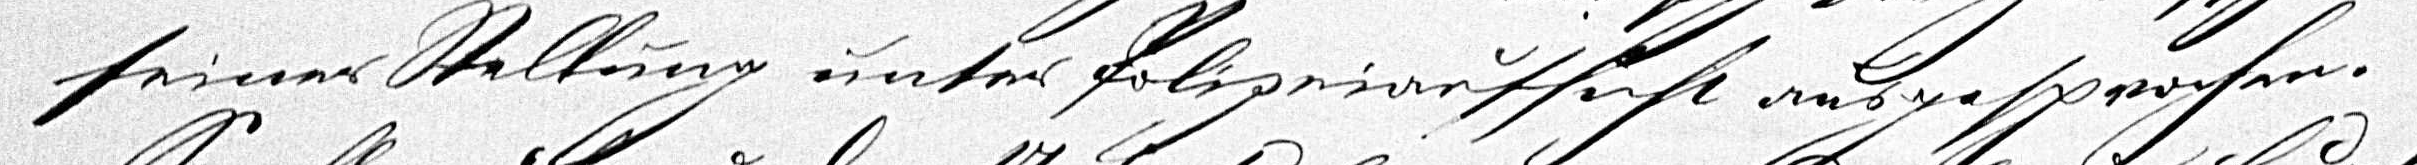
seiner Stellung unter Polizeiaufsucht ausgesprochen.
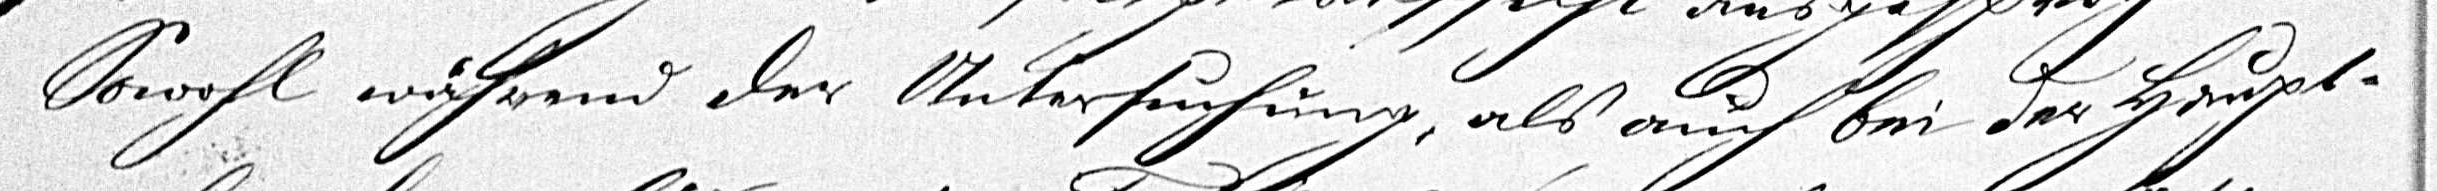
Sowohl während der Untersuchung als auch bei der Haupt¬
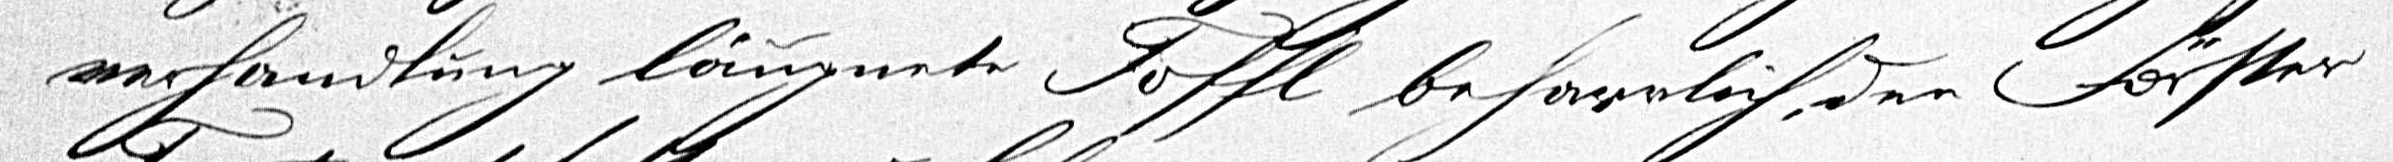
verhandlung läugnete Toffl beharrlich, den Förster
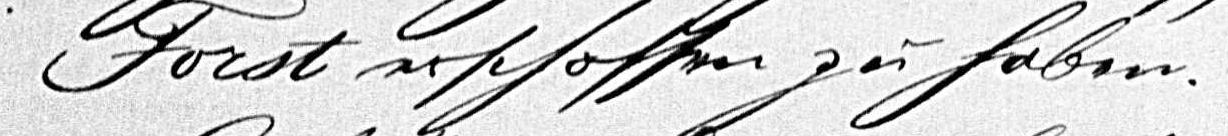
Forst erschossen zu haben.
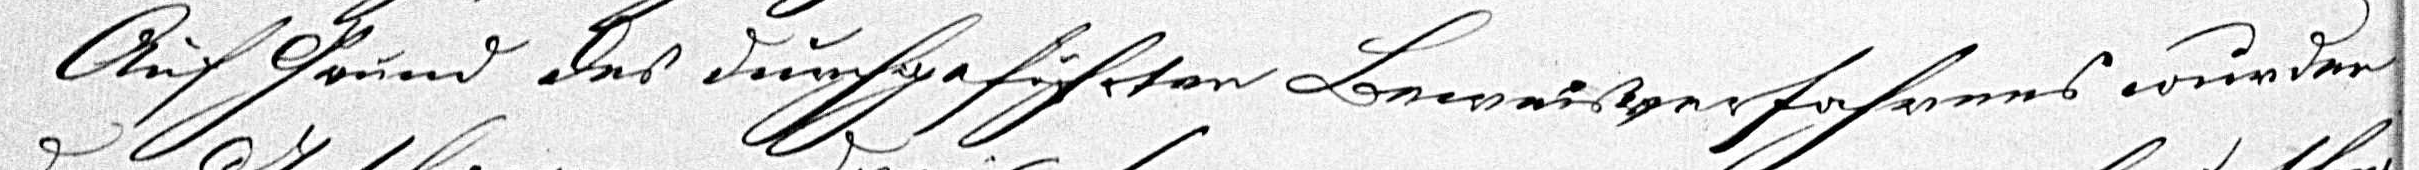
Auf Grund des durchgeführten Beweisverfahrens wurden
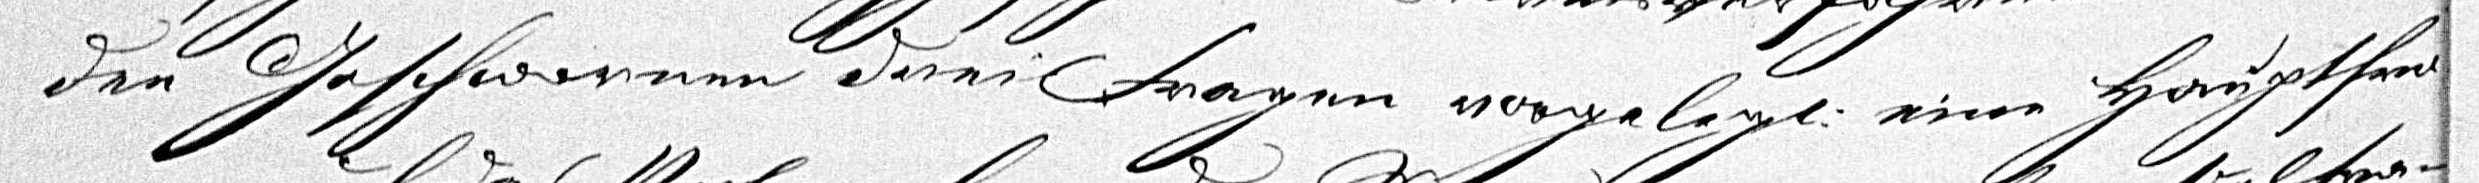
den Geschworenen drei Fragen vorgelegt: eine Hauptfra¬
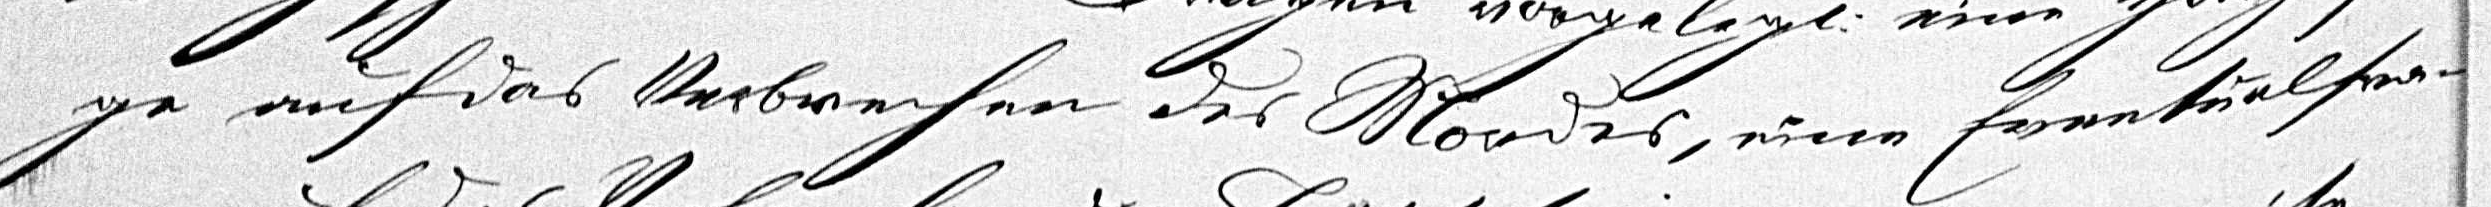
ge auf das Verbrechen des Mordes, eine Eventualfra¬
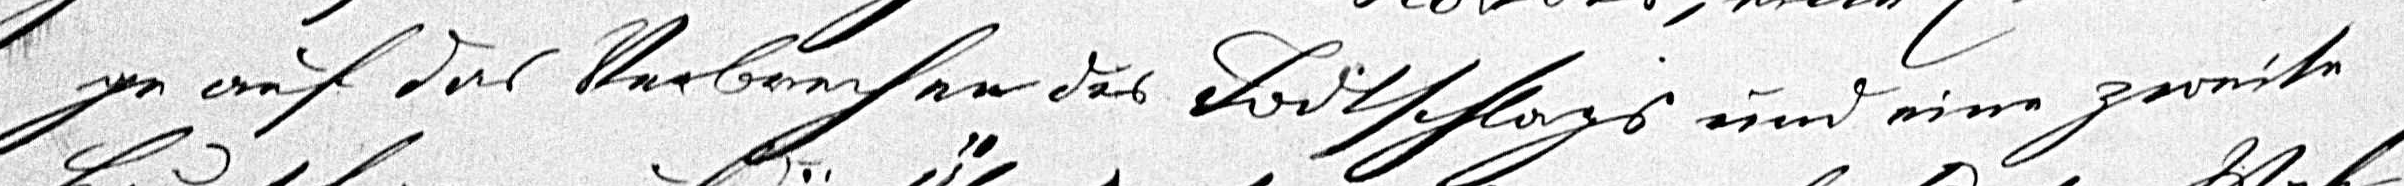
ge auf das Verbrechen des Todtschlages und eine zweite
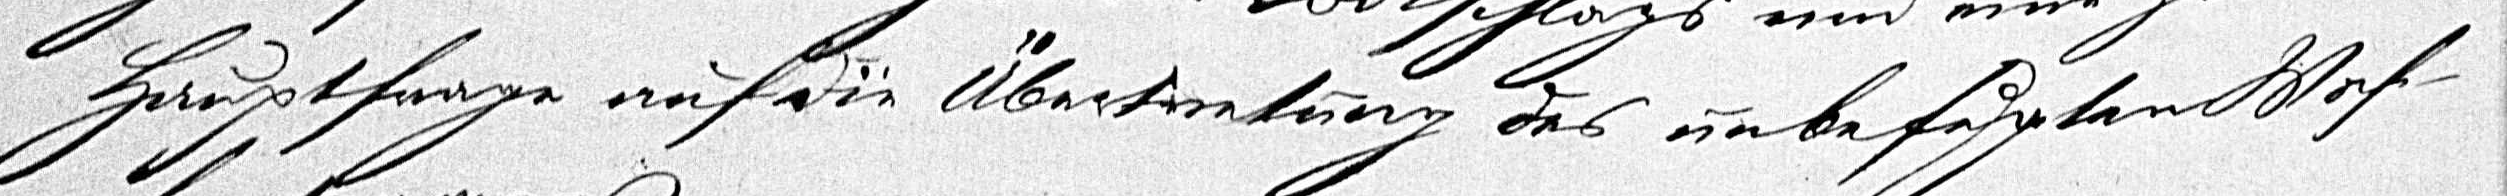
Hauptfrage auf die Übertretung des unbefugten Waf¬
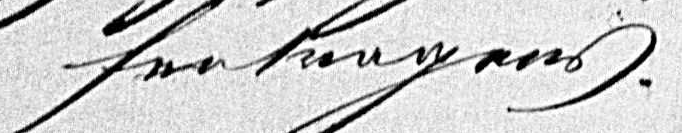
fentragens.
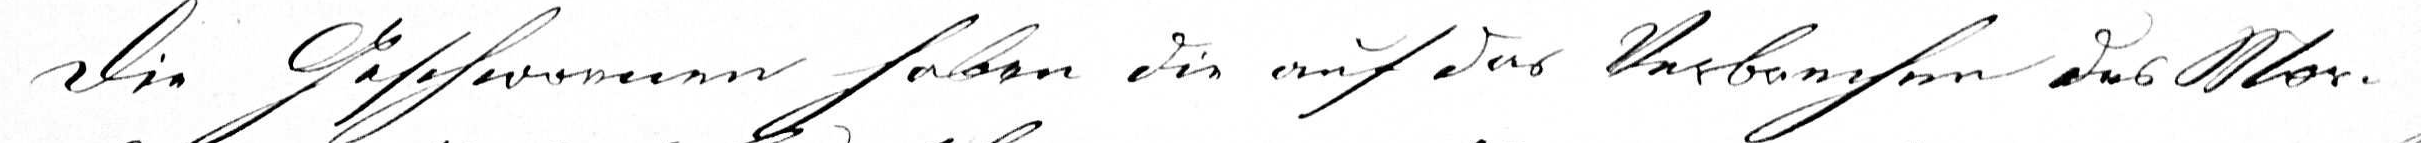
Die Geschwornen haben die auf das Verbrechen des Mor¬
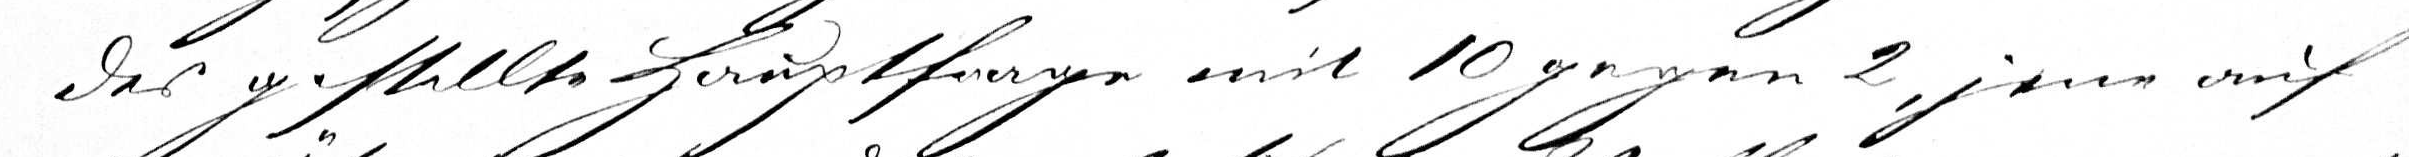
des gestellte Hauptfrage mit 10 gegen 2, jene auf
